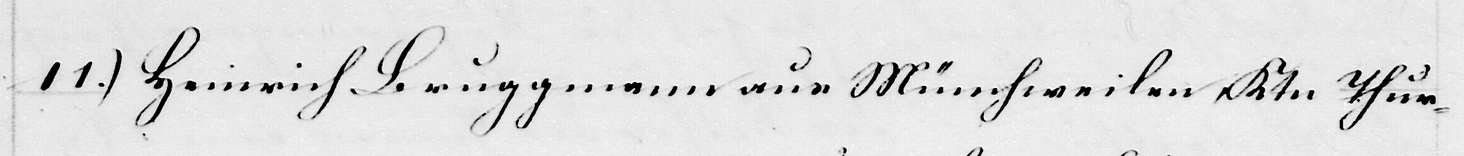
11.) Heinrich Bruggmann aus Münchweilen, Ktn Thur¬
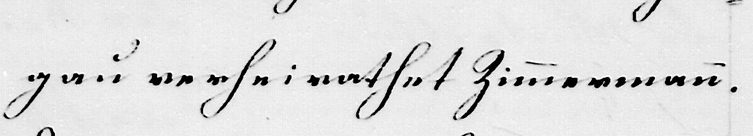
gau verheirathet Zimmermann.
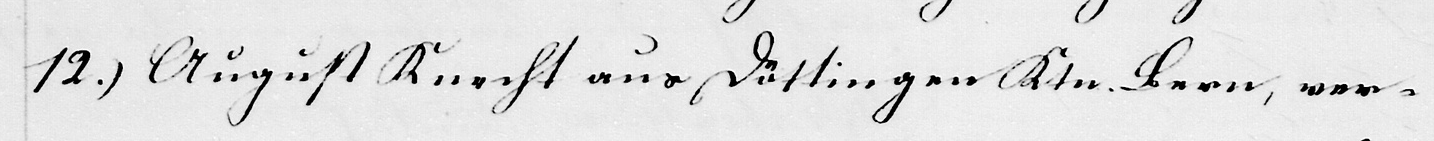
12.) August Knecht aus Döttingen Ktn. Bern, ver¬
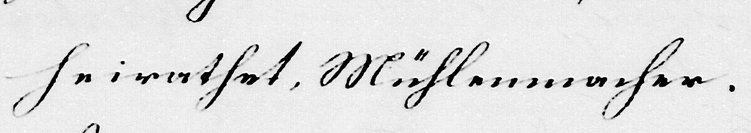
heirathet, Mühlenmacher.
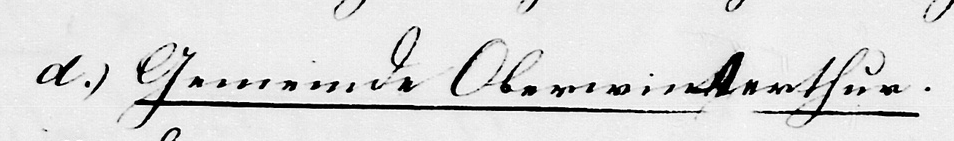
d.) Gemeinde Oberwinterthur.
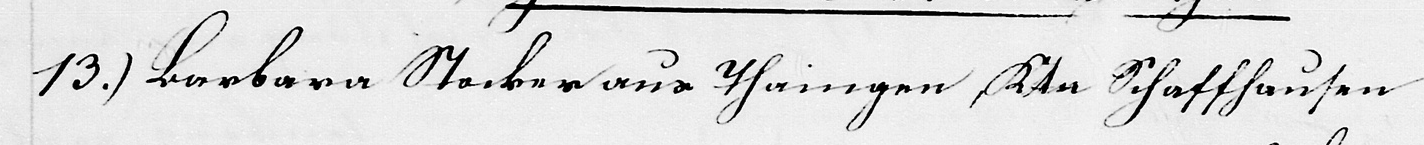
13.) Barbara Stocker aus Thaingen, Ktn Schaffhausen
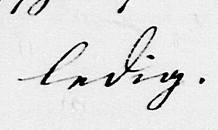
ledig.
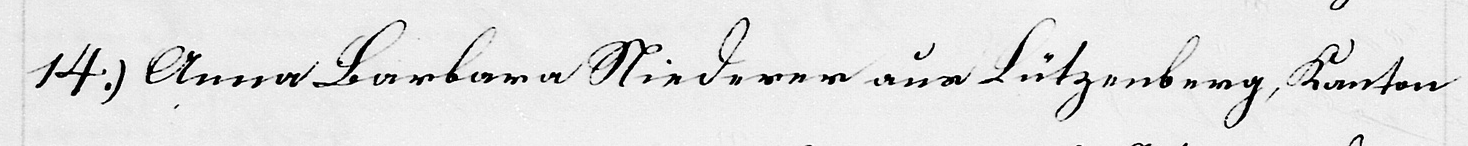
14.) Anna Barbara Niederer aus Lützenberg, Kanton
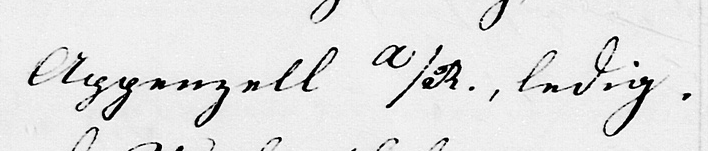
Appenzell A/R., ledig.
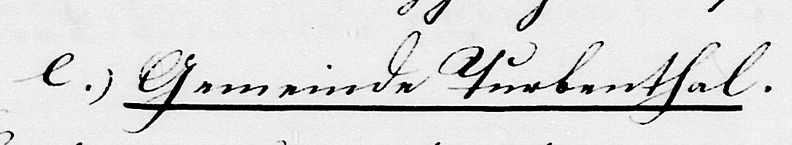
e.) Gemeinde Turbenthal.
